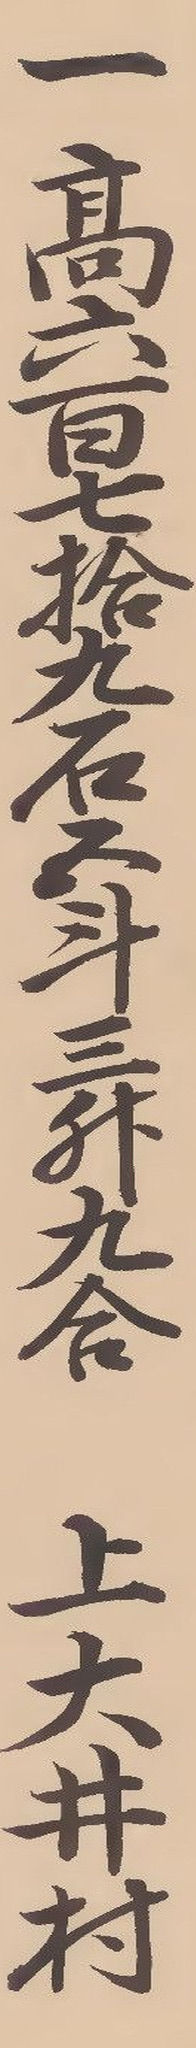一高六百七拾九石五斗三升九合上大井村
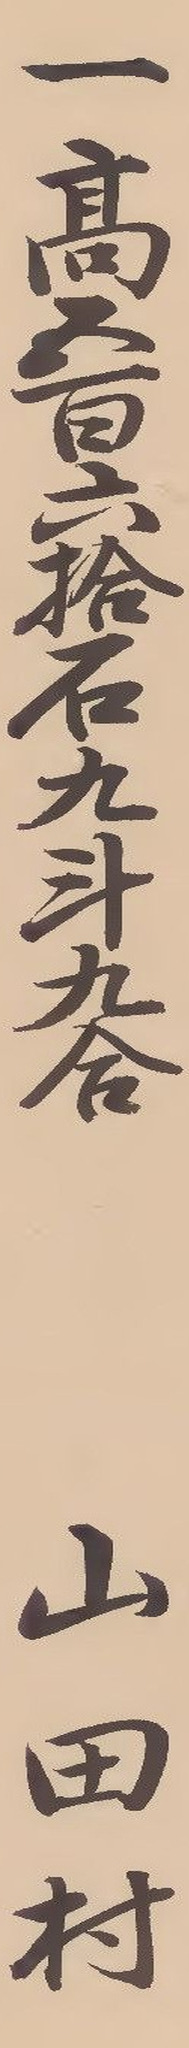一高五百六拾石九斗九合山田村
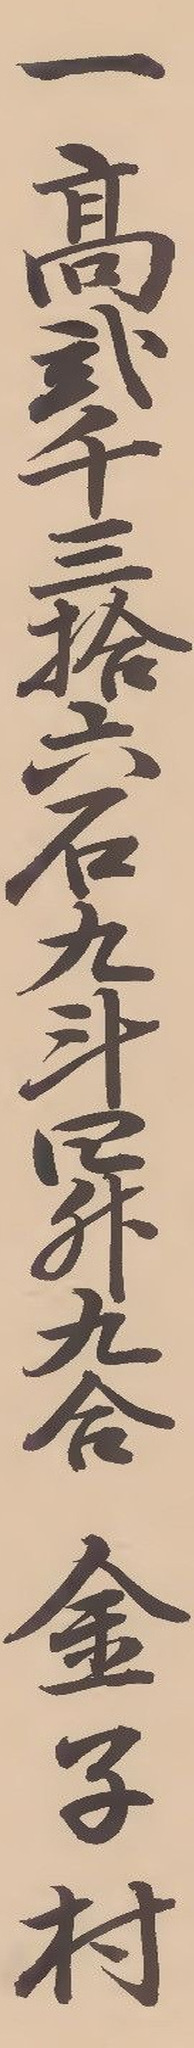一高弐千三拾六石九斗四升九合金子村
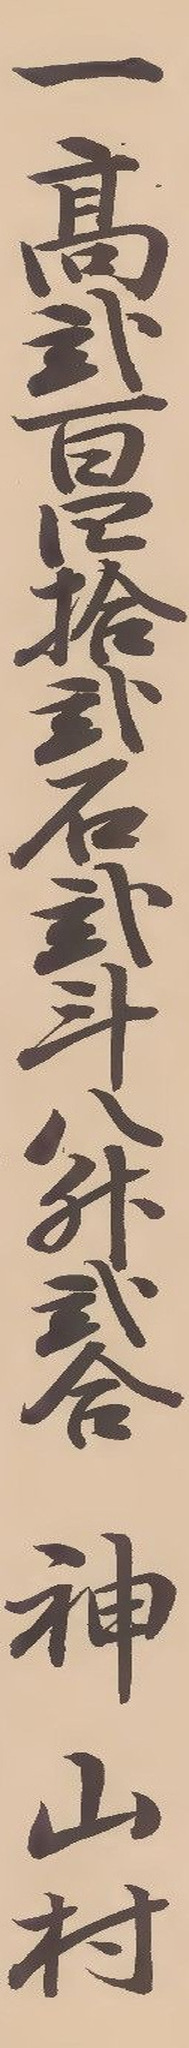一高弐百四拾弐石弐斗八升弐合神山村
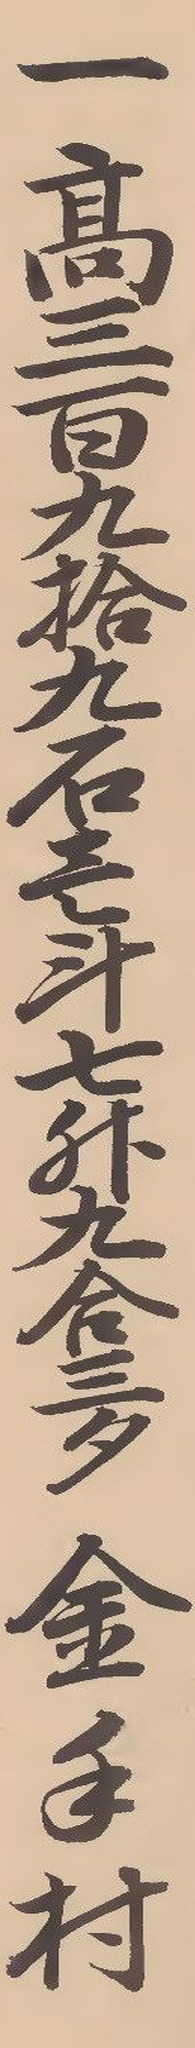一高三百九拾九石壱斗七升九合三勺金手村
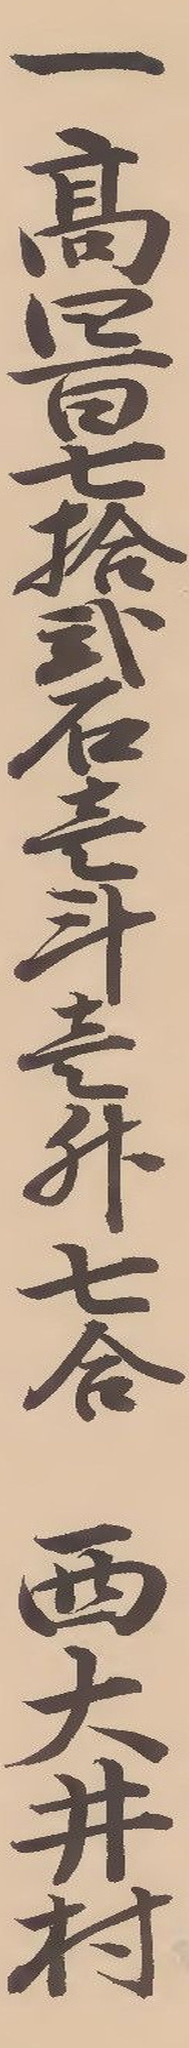一高四百七拾弐石壱斗壱升七合西大井村
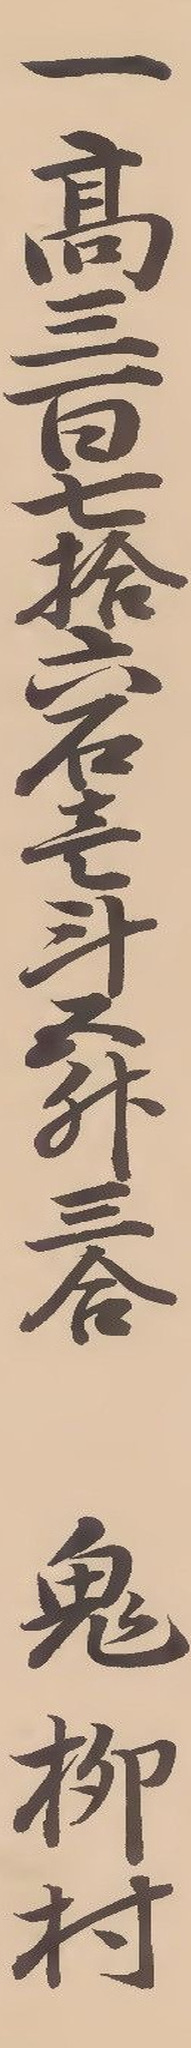一高三百七拾六石壱斗五升三合鬼柳村
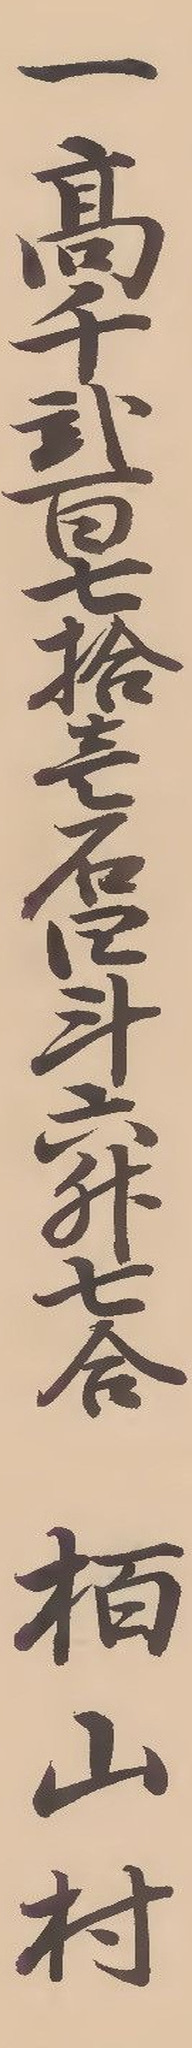一高千弐百七拾壱石四斗六升七合栢山村

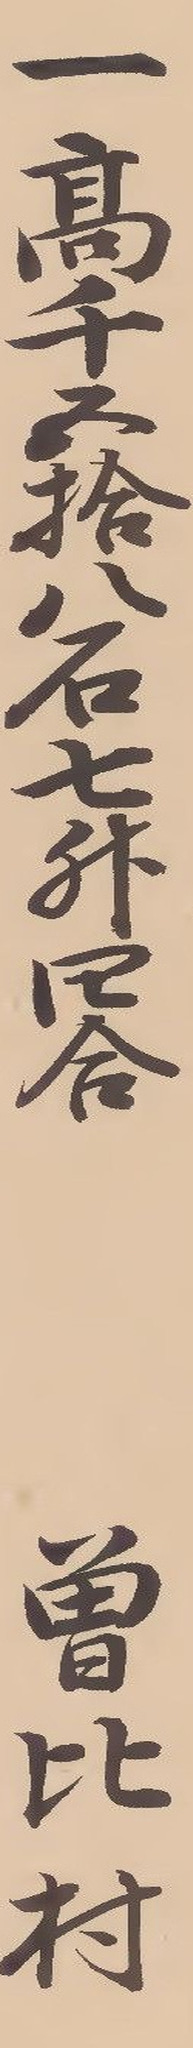一高千五拾八石七升四合曽比村
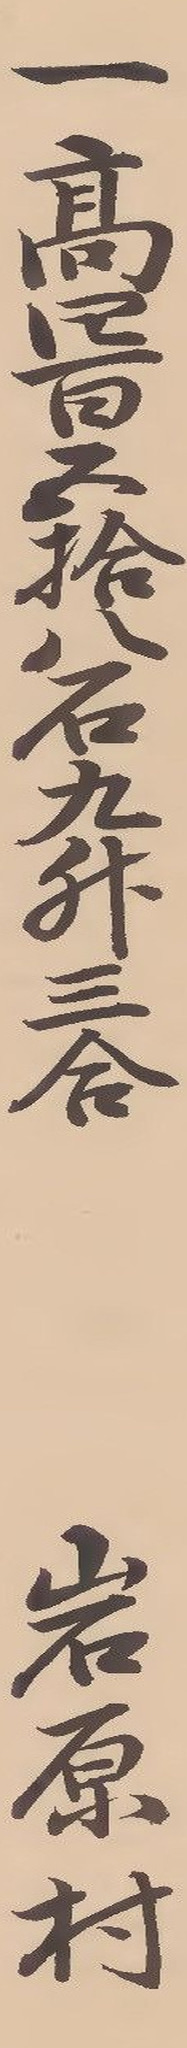一高四百五拾八石九升三合岩原村
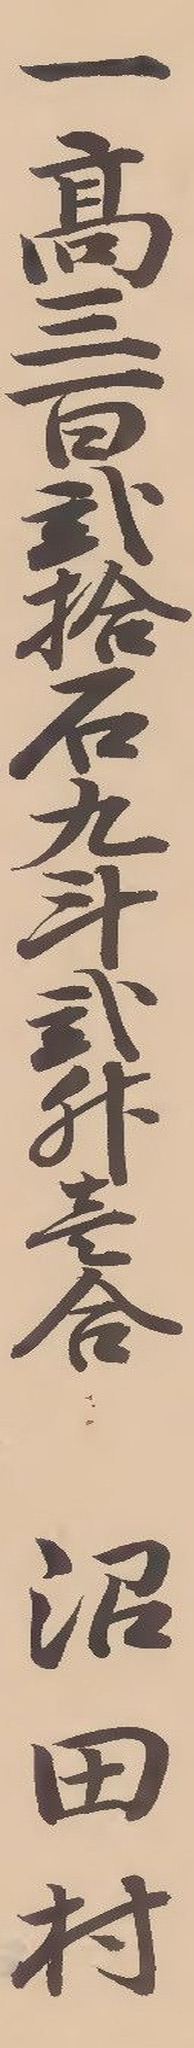一高三百弐拾石九斗弐升壱合沼田村
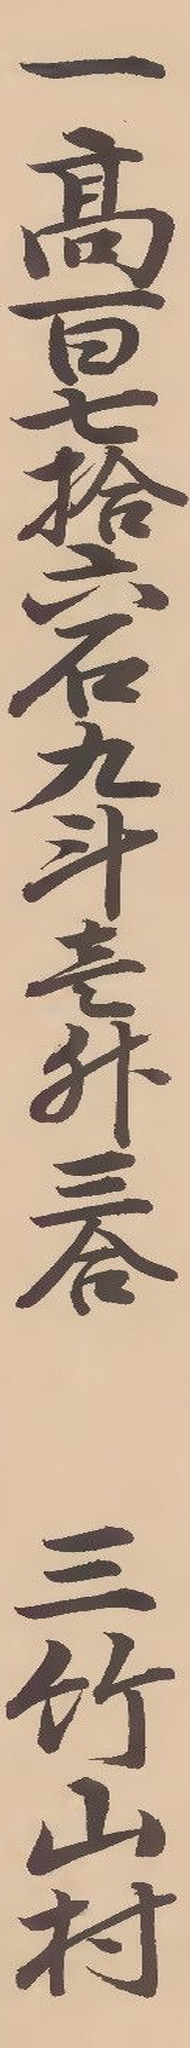一高百七拾六石九斗壱升三合三竹山村
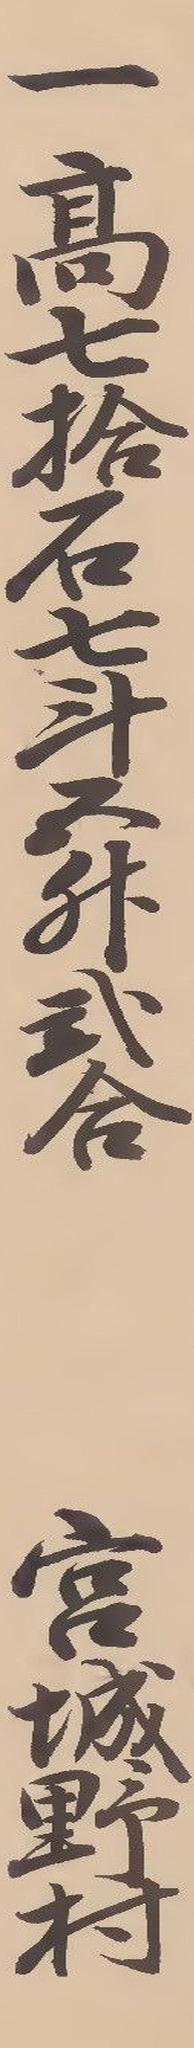一高七拾石七斗五升弐合宮城野村
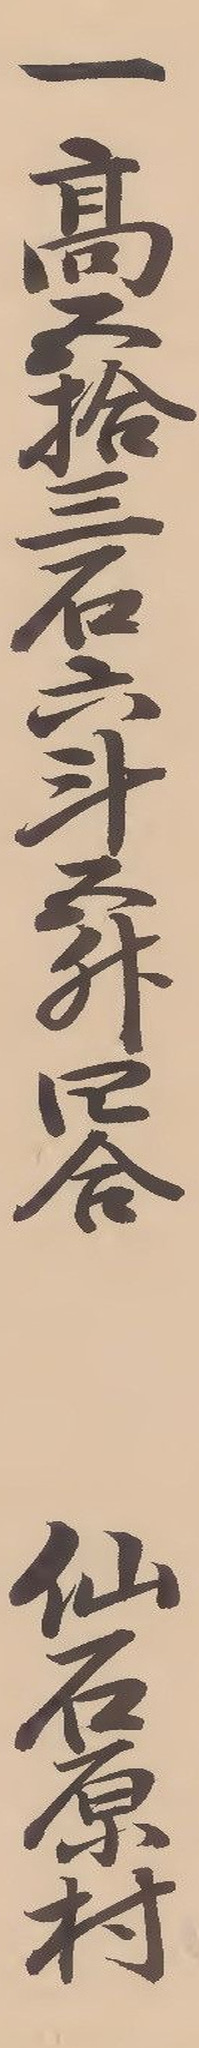一高五拾三石六斗五升四合仙石原村
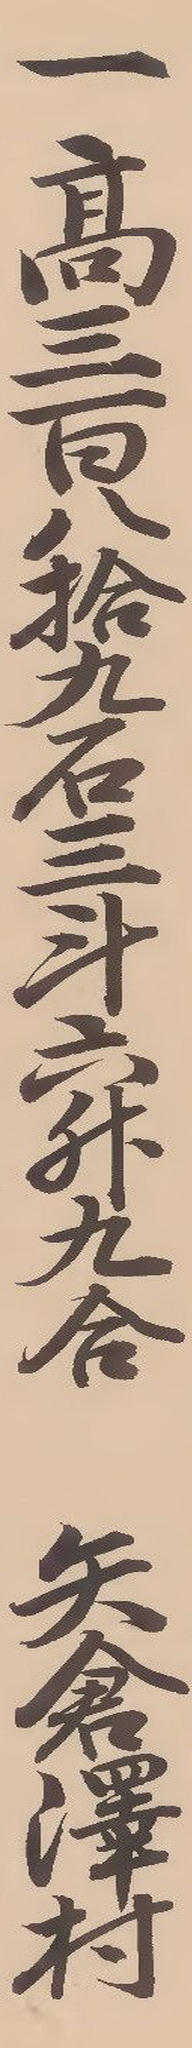一高三百八拾九石三斗六升九合矢倉澤村
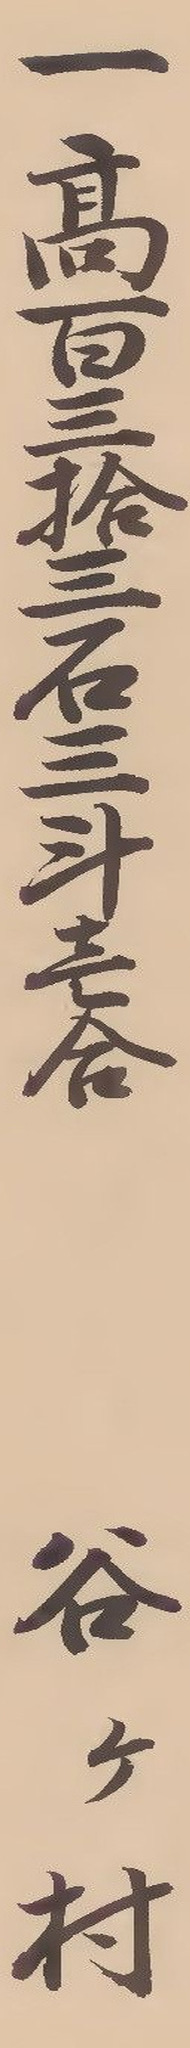一高百三拾三石三斗壱合谷ヶ村
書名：相模国郷帳
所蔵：国立公文書館 National Archives of Japan
